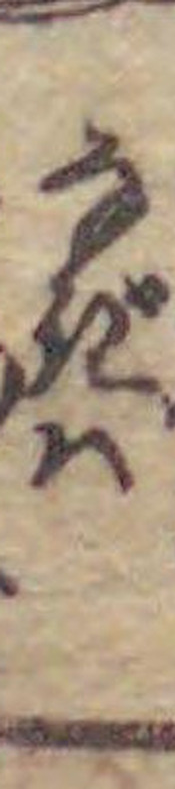なぎは
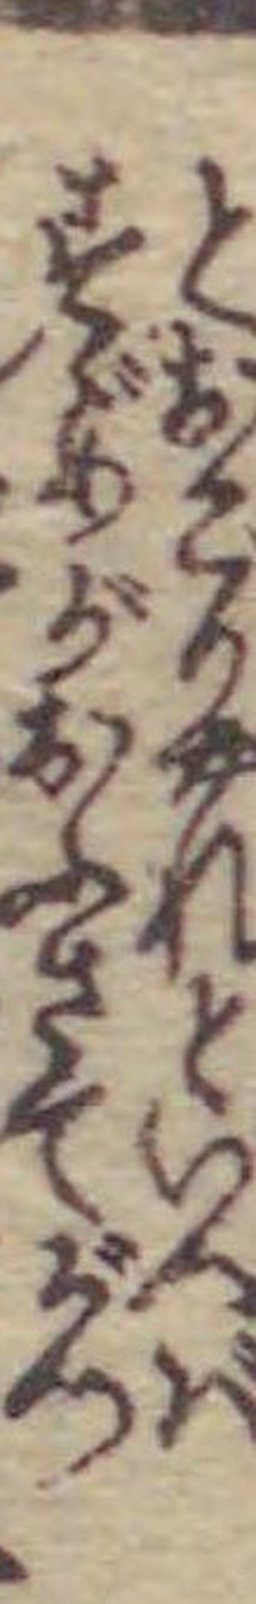すゞめがおふさてがつ
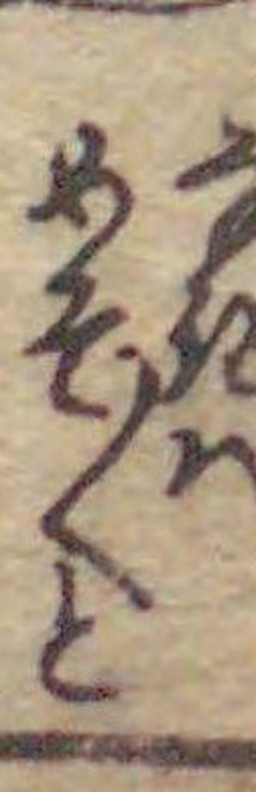めそ〳〵と
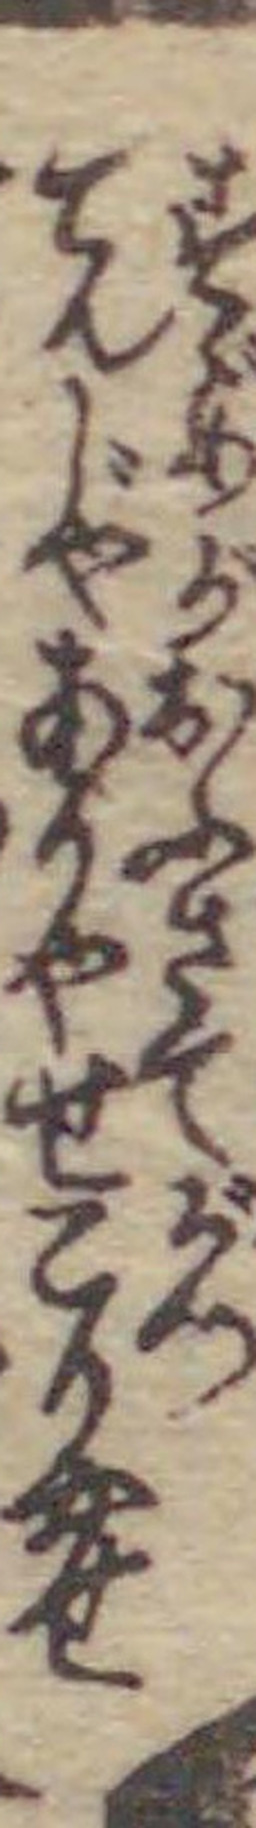てんじやありやせこりやせ
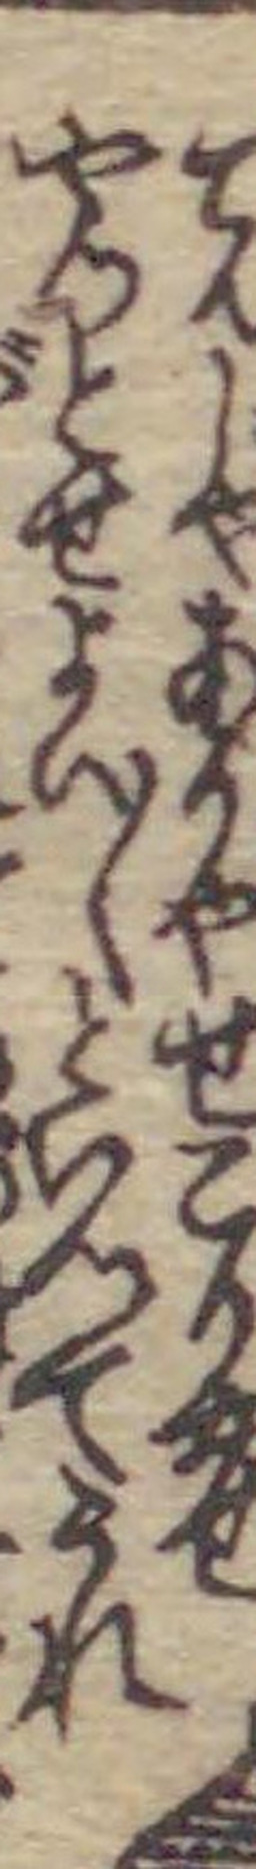やつとせよい〳〵といつてうれ
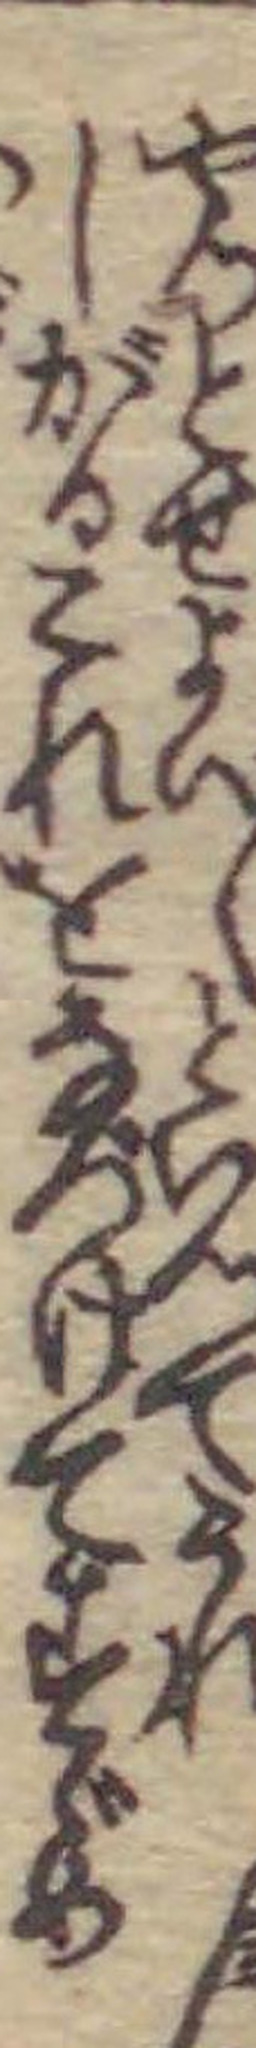しがるこれをなづけてすゞめ
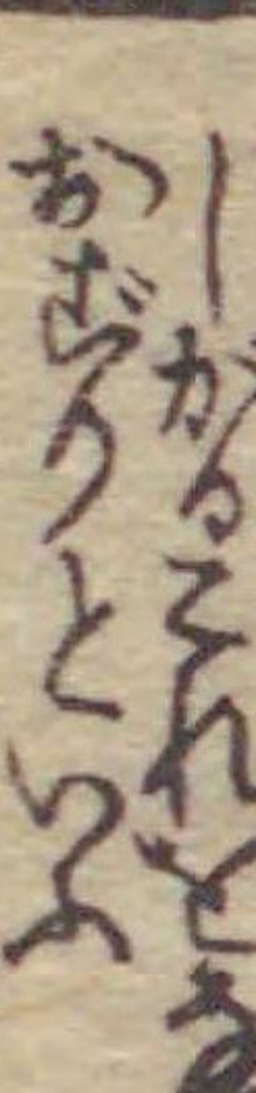おごりといふ

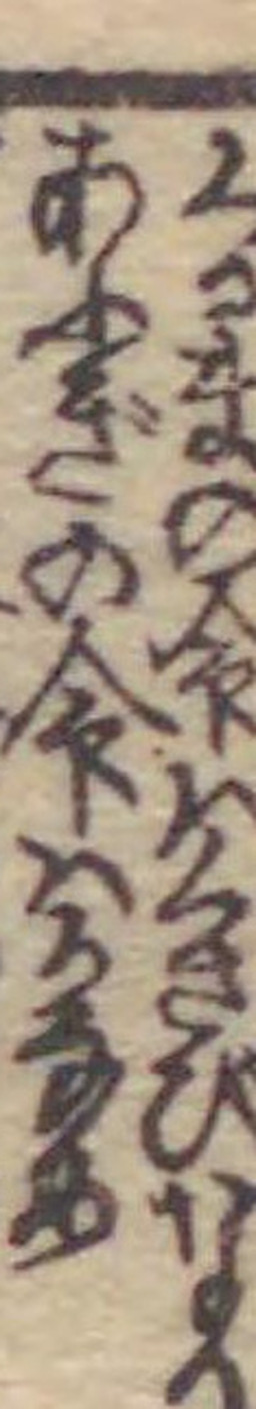あふぎの命はかなめ
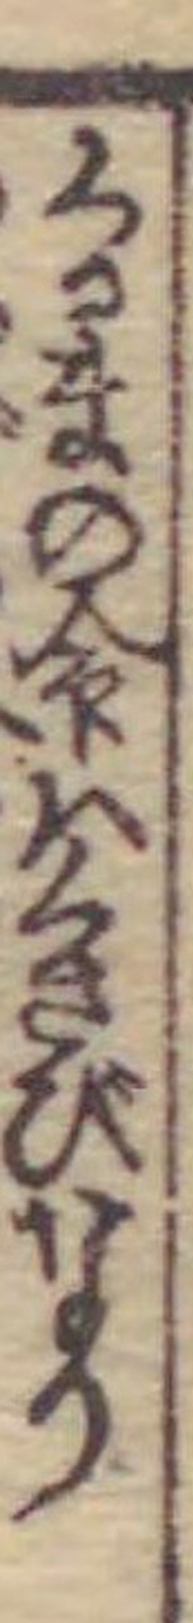くるまの命はくさびなり
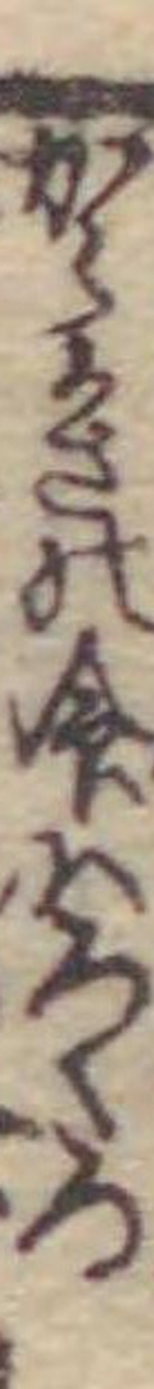からかさの命はろくろ
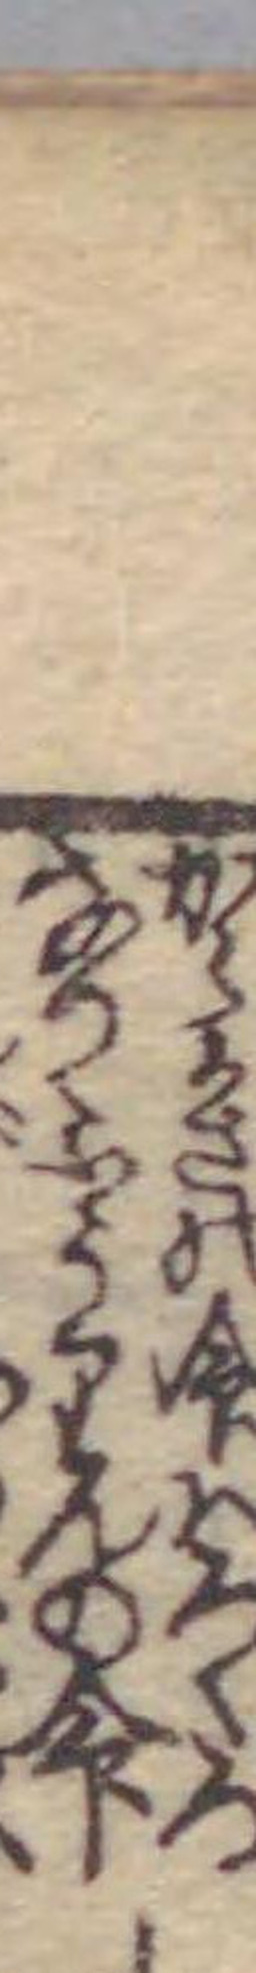なりふうりんの命
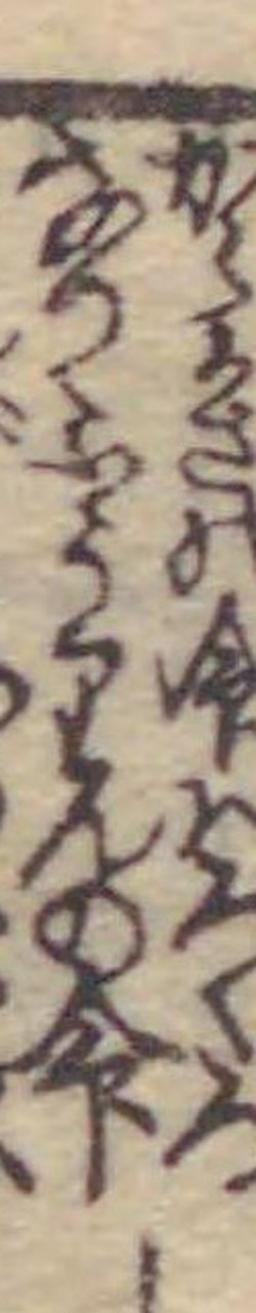なりふうりんの命
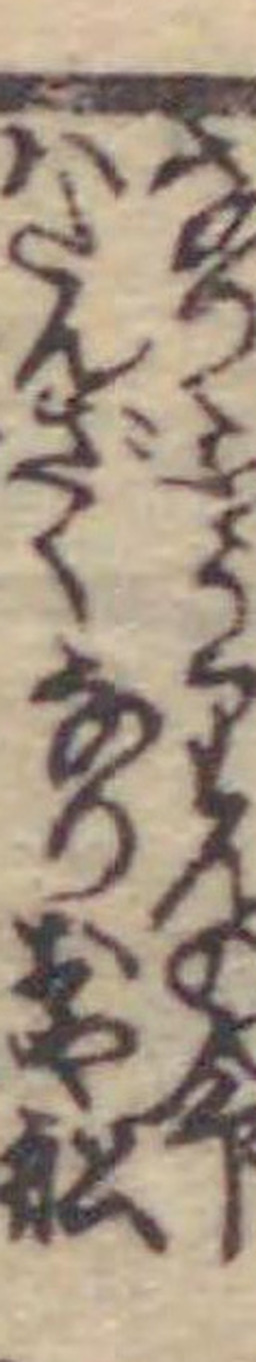はたんざくなりおや船
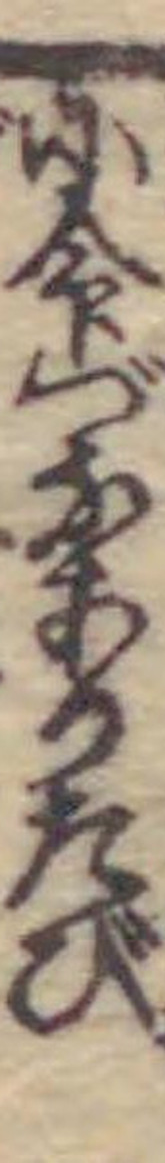に命づなありたび
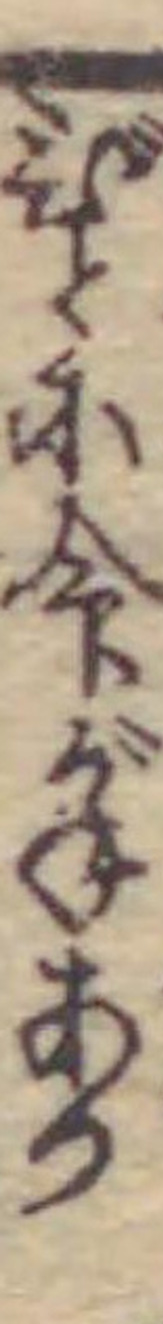びとに命がねあり
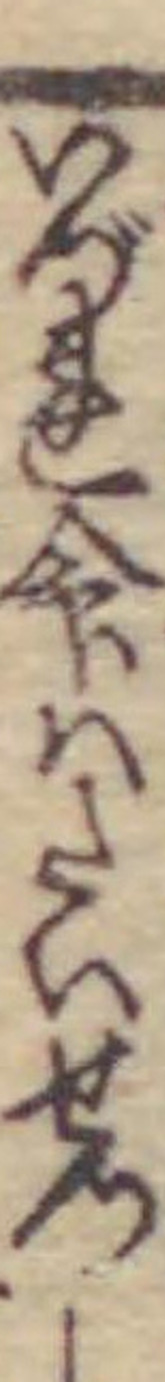いづれ命はたいせつ
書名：御誂染長寿小紋 : 3巻
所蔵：国立国会図書館 National Diet Library, JAPAN
